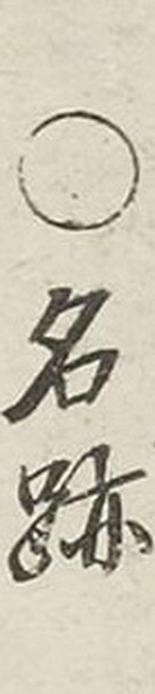○名跡
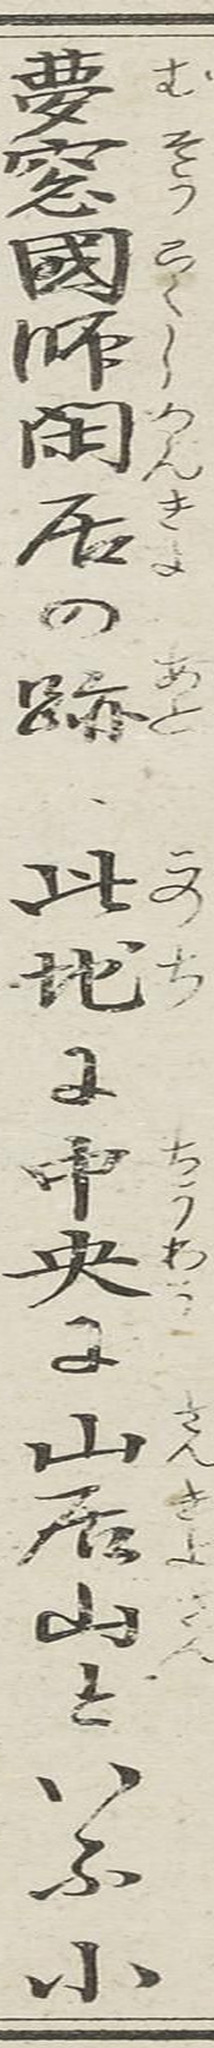夢窓國師閑居の跡此地に中央に山居山といふ小
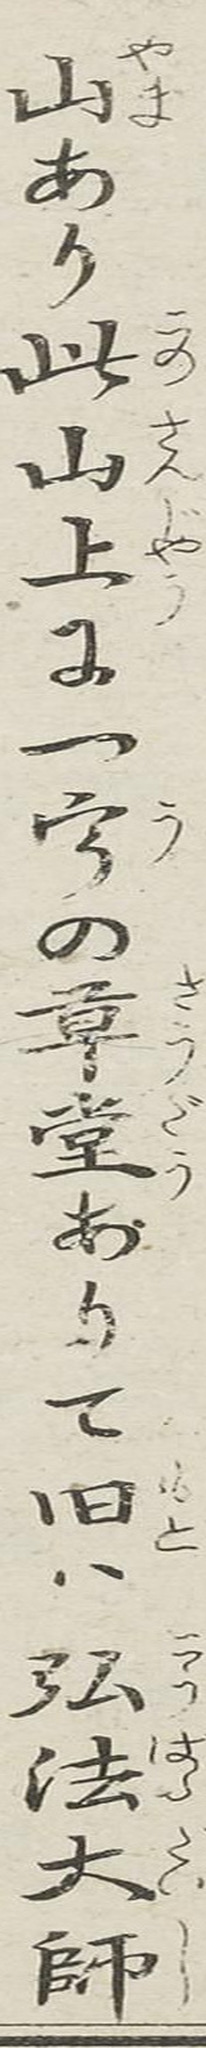山あり此山上に一宇の草堂ありて旧は弘法大師
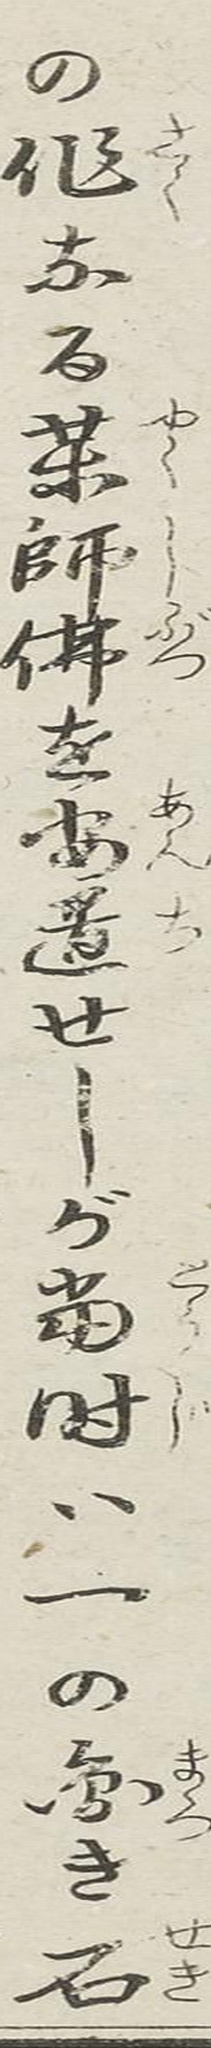の作なる薬師佛を安置せしが当時は一の圓き石
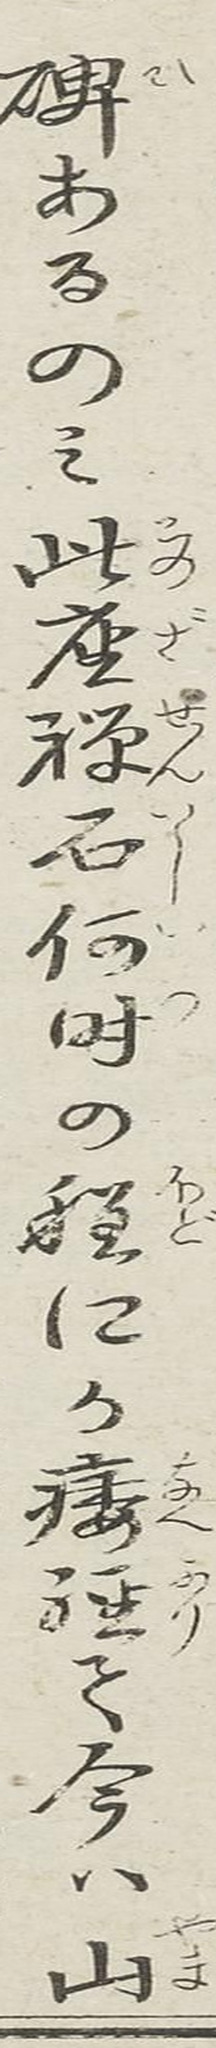碑あるのみ此座禅石何時の程にか痿経て今は山
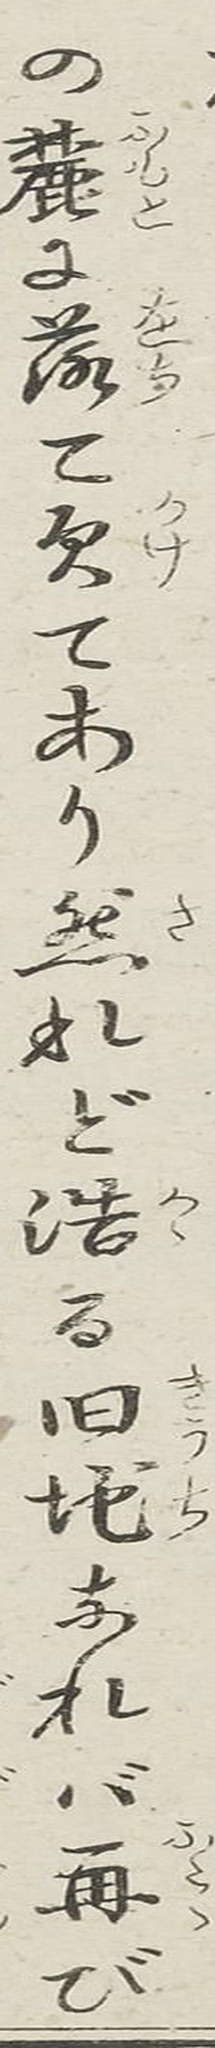の麓に落て欠てあり然れど渉る旧地なれば再び
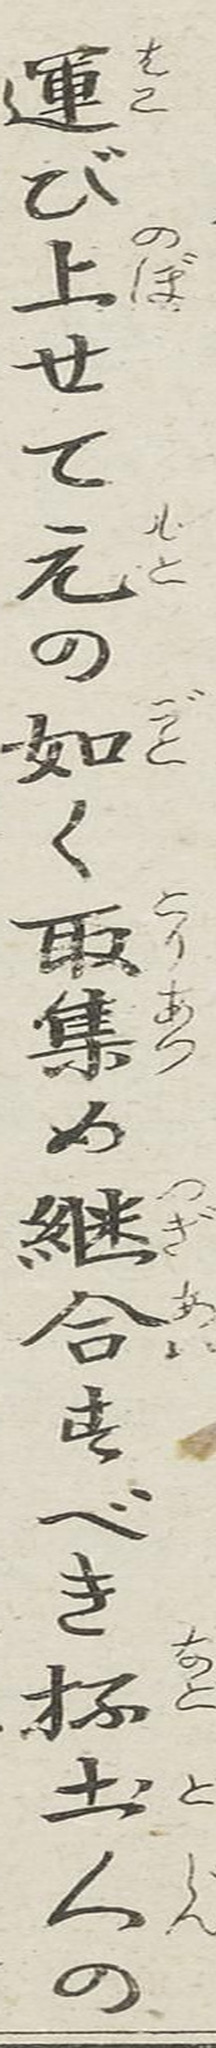運び上せて元の如く取集め継合すべき抔土人の
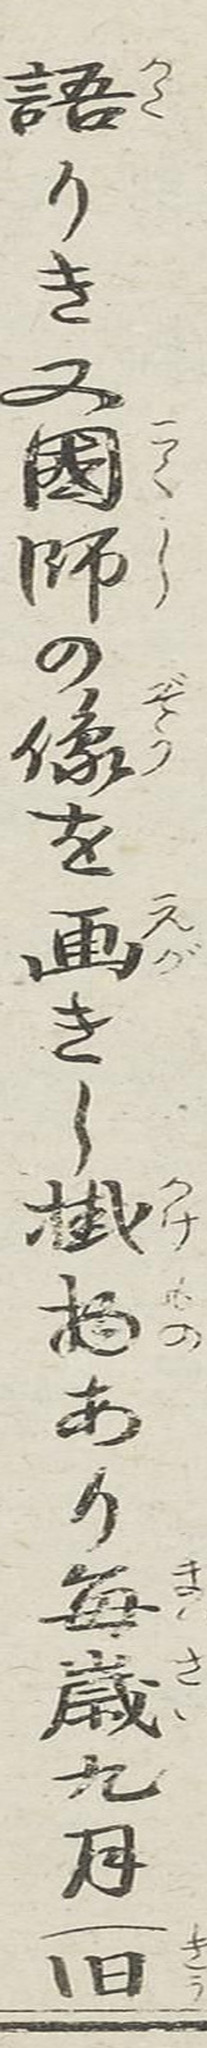語りき又國師の像を画きし掛物あり毎歳九月
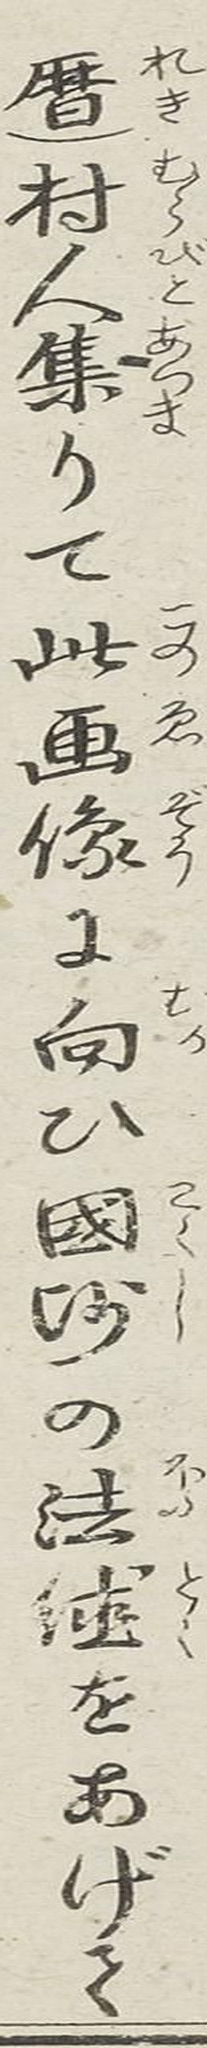暦）村人集りて此画像に向ひ國師の法徳をあげて
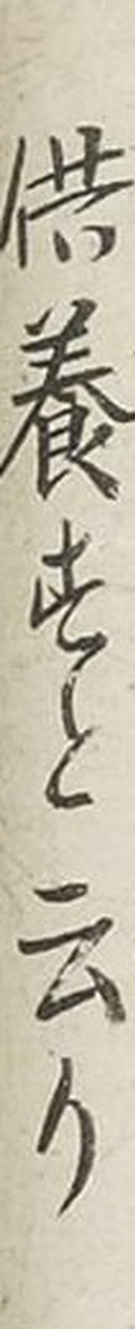供養すと云り
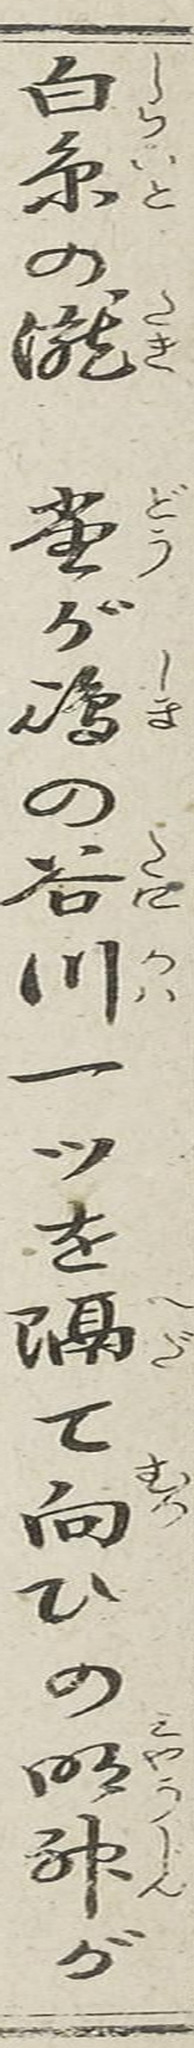白糸の瀧堂が嶋の谷川一ッを隔て向ひの明神が
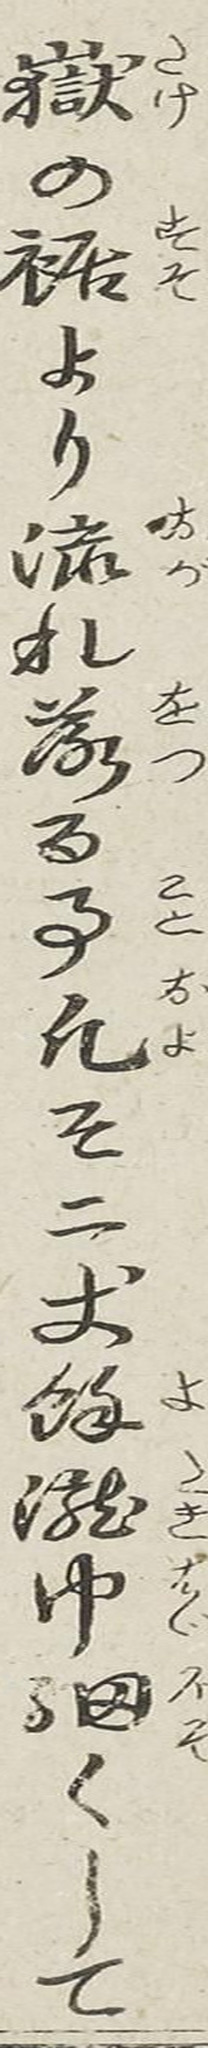嶽の裾より流れ落る事凡そ二丈餘瀧巾細くして
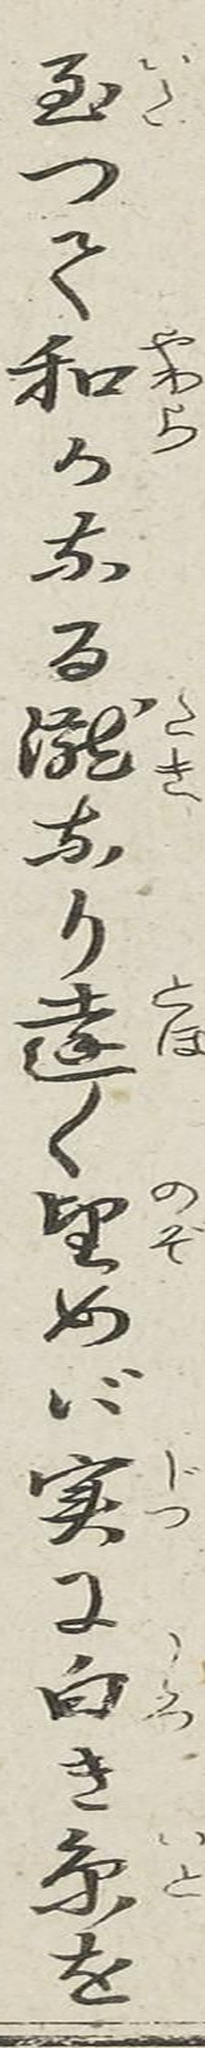至つて和かなる瀧なり遠く望めば実に白き糸を
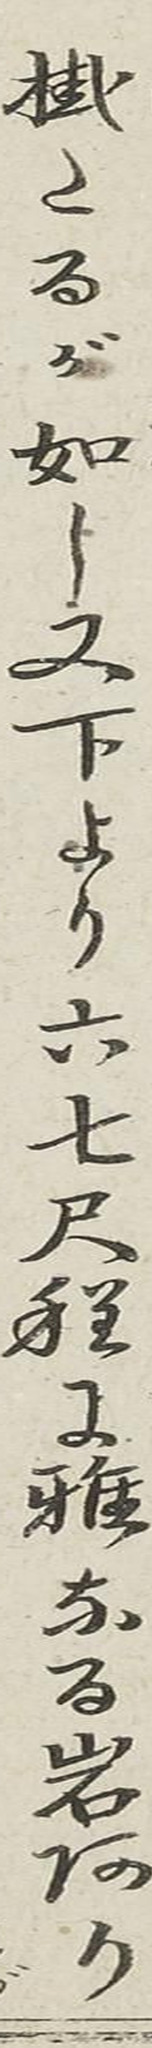掛たるが如し又下より六七尺程に雅なる岩あり
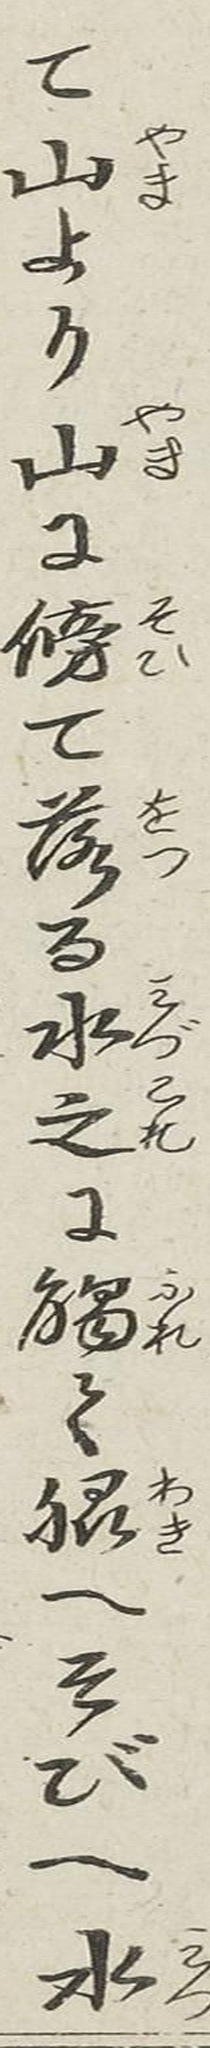て山より山に傍て落る水之に触て脇へそびへ水
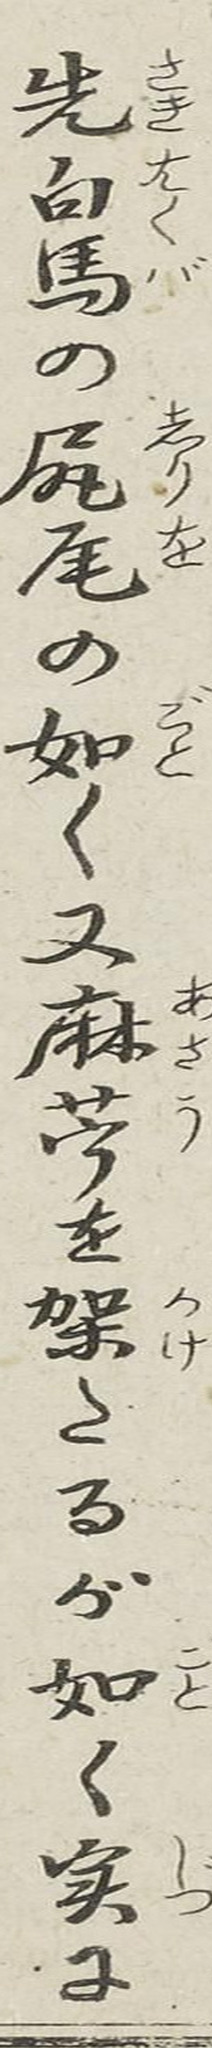先白馬の尻尾の如く又麻荢を架たるが如く実に
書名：箱根温泉誌　全
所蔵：東京大学地震研究所図書室 Earthquake Research Institute Library, The University of Tokyo, JAPAN
